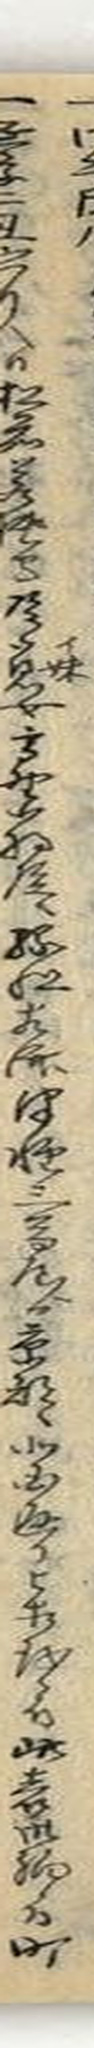一延享二丑六月八日松前若狭守殿御息女高野少将殿へ縁組相済津軽三馬屋ゟ京都へ北国通り被相越候ニ付此表御泊ニ付町
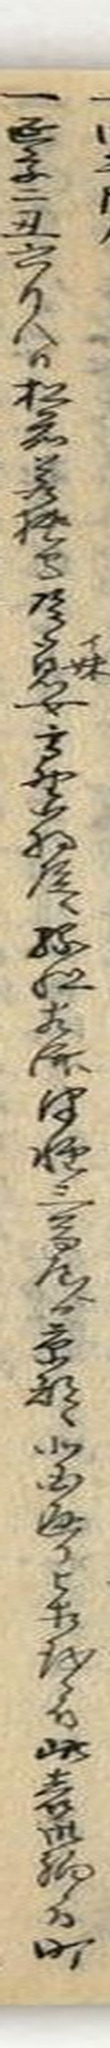一延享二丑六月八日松前若狭守殿御息女高野少将殿へ縁組相済津軽三馬屋ゟ京都へ北国通り被相越候ニ付此表御泊ニ付町
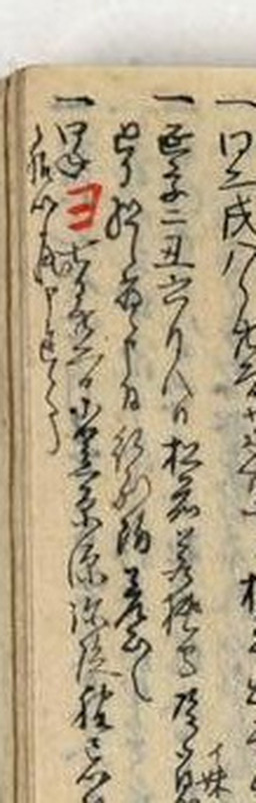廻り組之者へ申付行列附差出之
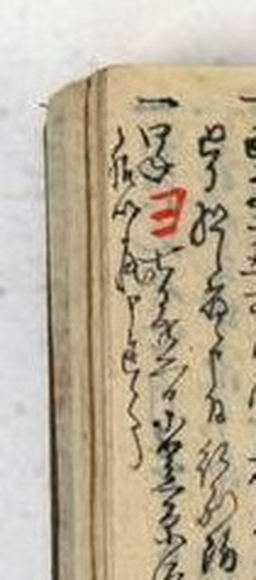候様以手紙申達候事

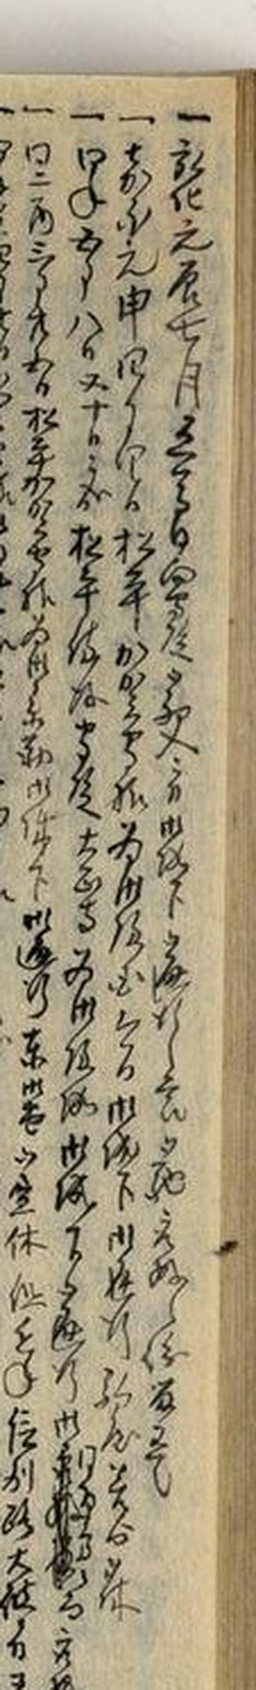一嘉永元申四月四日松平加賀守様為御帰国今日御城下御通行駒屋着ゟ御休
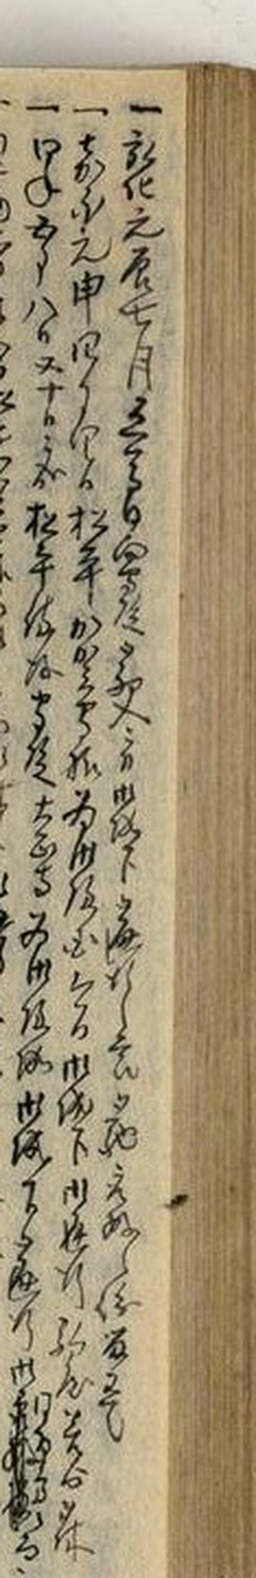一弘化元辰七月有馬日向守殿御初入ニ付御城下御通行之節御馳取扱之儀留有之
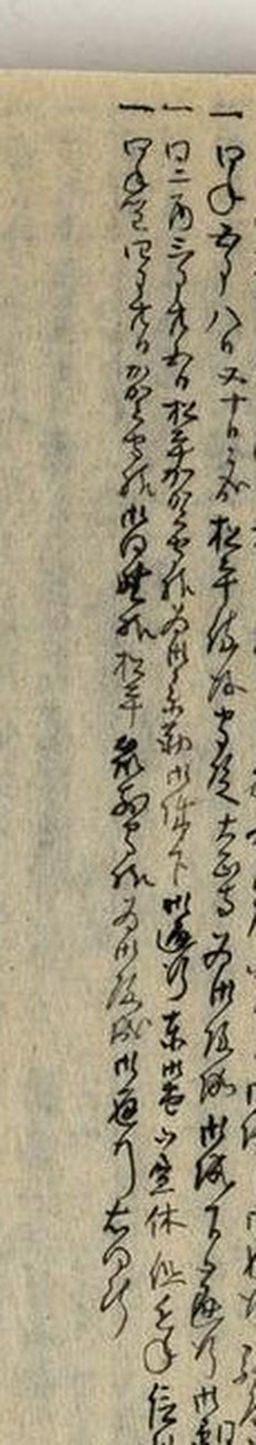一同年閏四月廿日加賀守様御同姓様松平筑前守様為御帰城御通行右同断

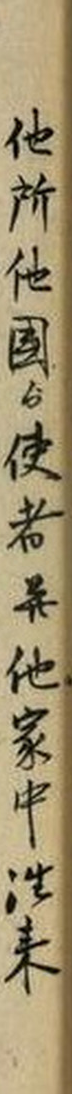他所他国ゟ使者幷他家中往来
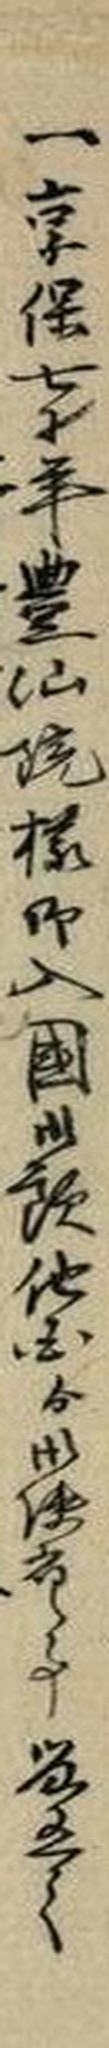一享保七寅年豊仙院様御入国御歓他国ゟ御使者之事留有之
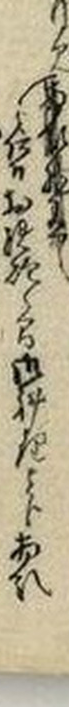被仰付於鉄炮之間御料理被下拝領
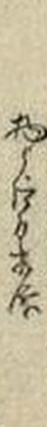物被仰付相渡
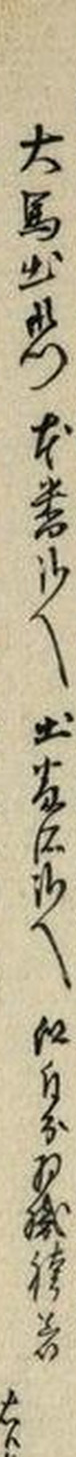大馬出御門本番弐人出番所弐人但自分羽織袴着
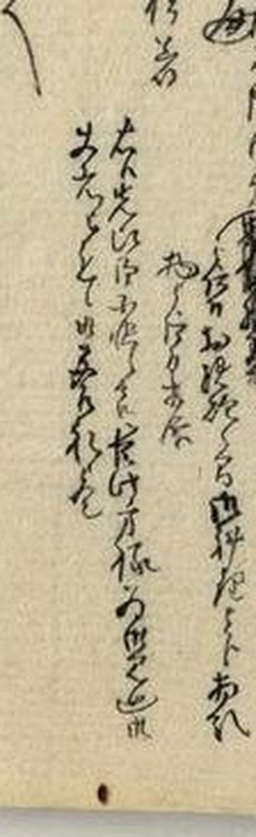右ハ先頃御不快之節従此方様為御見廻御
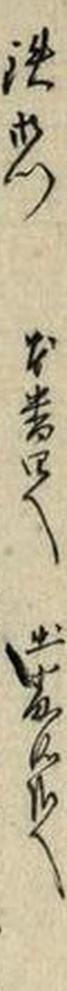鉄御門本番四人出番所弐人
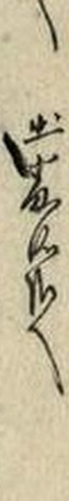出番所弐人
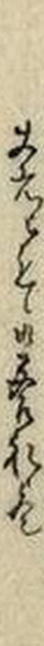使者被進候御答礼歟
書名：御国他国諸事之部
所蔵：福井県文書館 Fukui Prefectural Archives
